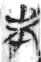未
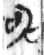申
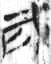戌
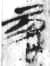亥
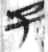子
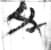丑
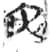寅
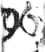卯
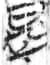是
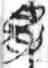{胃刀}（謂）
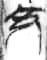交
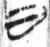日
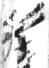利（利）
